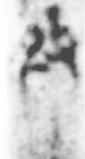牧
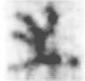之
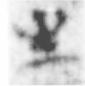生
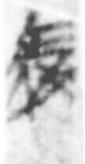駁
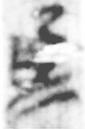爲
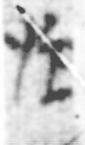○（左）
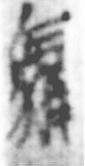○（服）
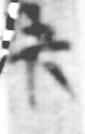夫
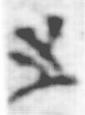之
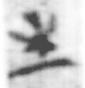生
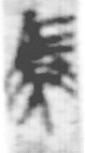駁
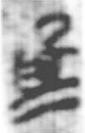爲
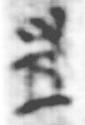○（右）
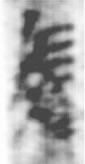○（服）
